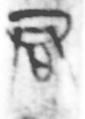君
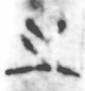之
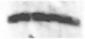一
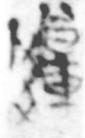車
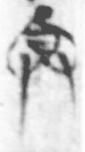弇
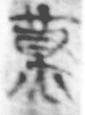黃
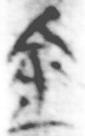金
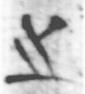之
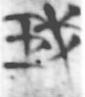○（飾）
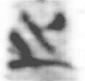之
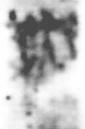無
